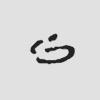㠯（以）
